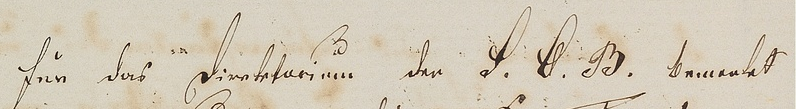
für das Direktorium der S.C.B. bemerkt
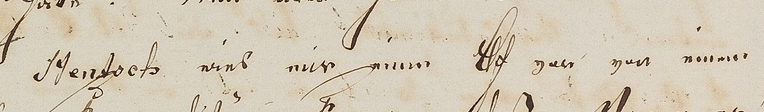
Hentsch wies mir einen Bf vor von einem
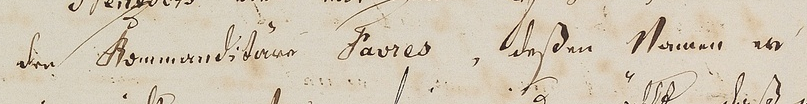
der Kommanditäre Favres, deßen Namen er
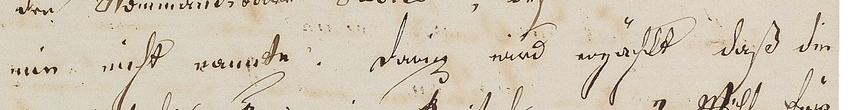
mir nicht nannte. Darin wird erzählt daß die
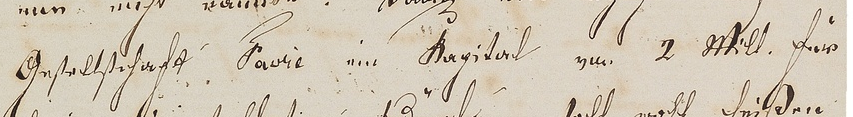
Gesellschaft Favre ein Kapital von 2 Mill. für
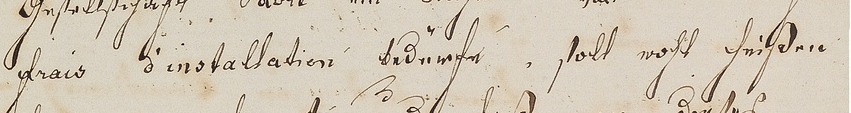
frais d'installation bedürfe, soll wohl heißen
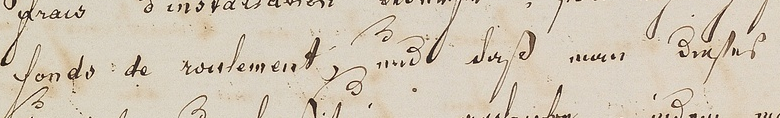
fonds de roulement, und daß man dieses
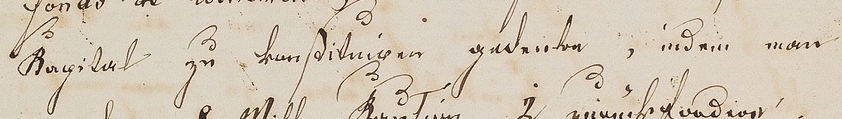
Kapital zu konstituiren gedenke, indem man
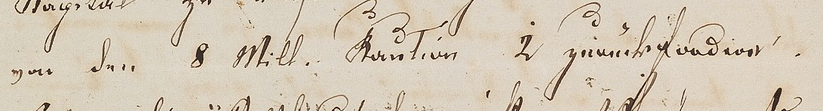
von den 6 Mill. Kaution 2 zurückfordere.
